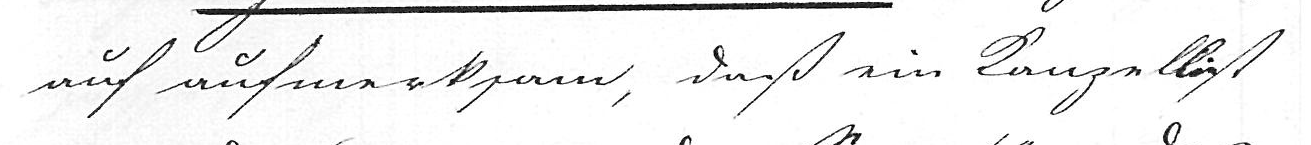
auf aufmerksam, daß ein Kanzellist
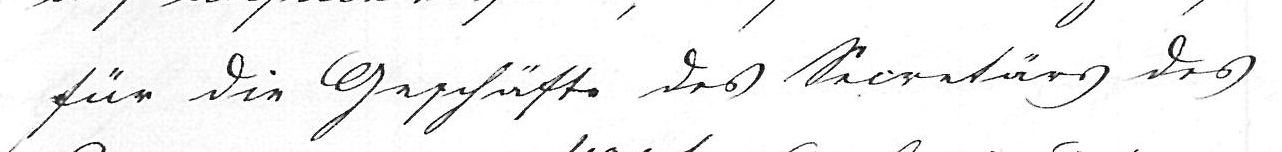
für die Geschäfte des Secretärs des
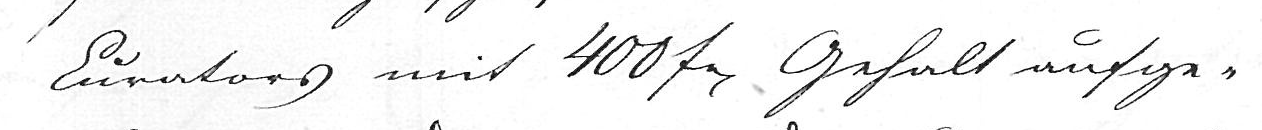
Curators mit 400 fl Gehalt aufge-
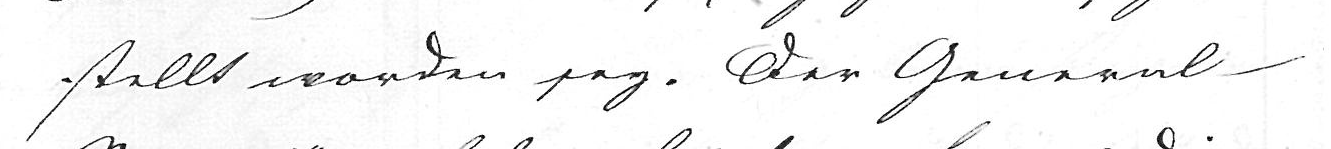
stellt worden sey. Der General-
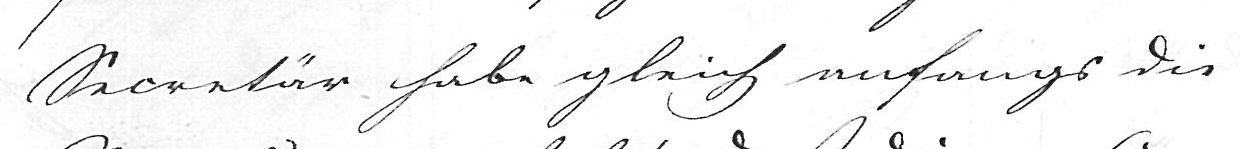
Secretär habe gleich anfangs die
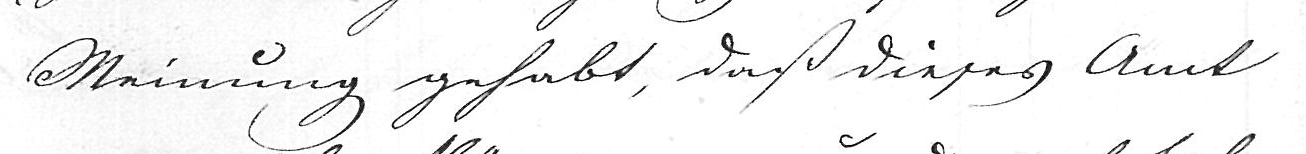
Meinung gehabt, daß dieses Amt
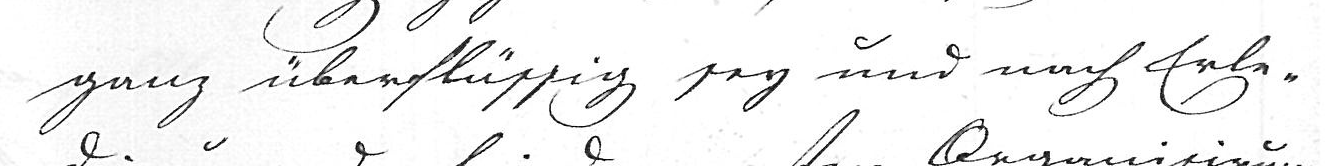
ganz überflüssig sey und nach Erle-
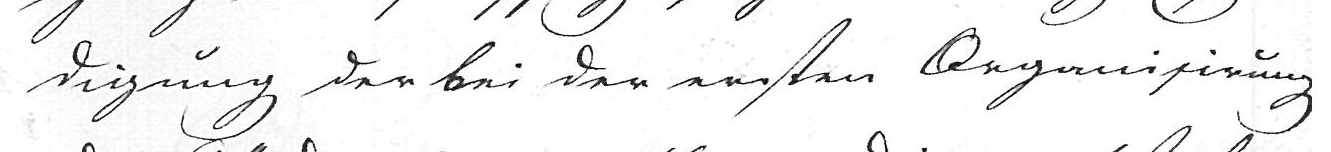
digung der bei der ersten Organisierung
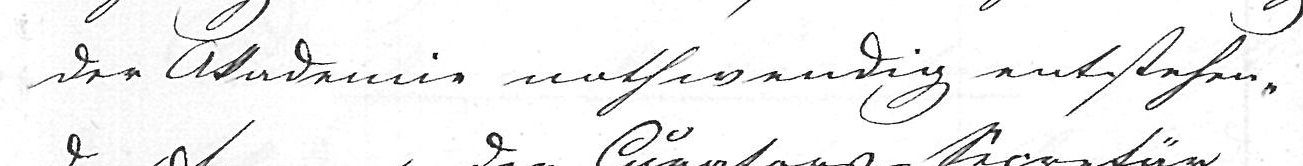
der Akademie nothwendig entstehten-
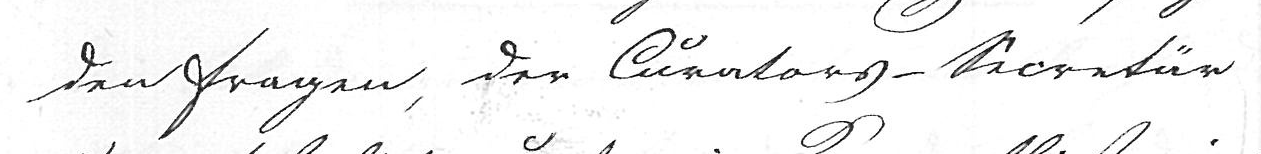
den Fragen der Curators-Secretär
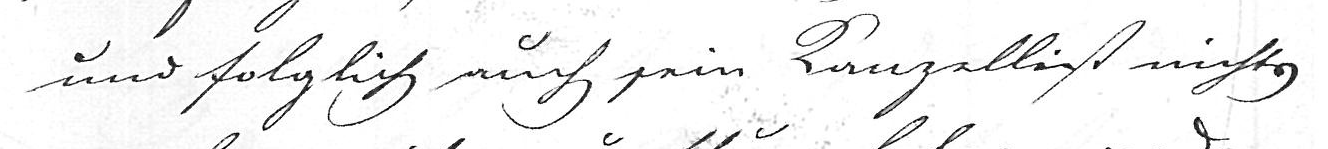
und folglich auch sein Kanzellist nichts
